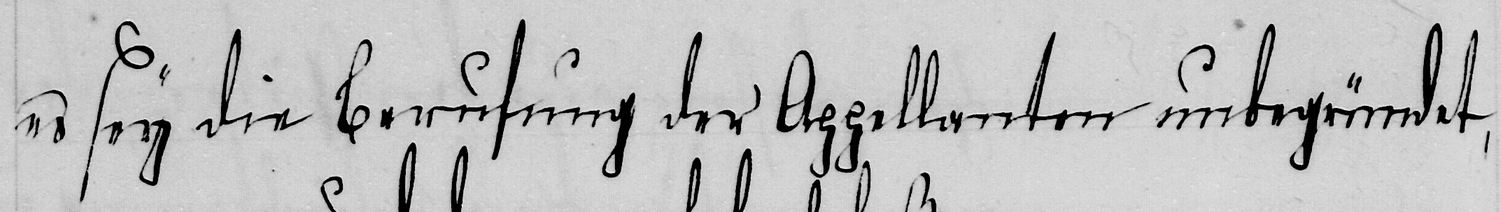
es sey die Berufung der Appellanten unbegründet,
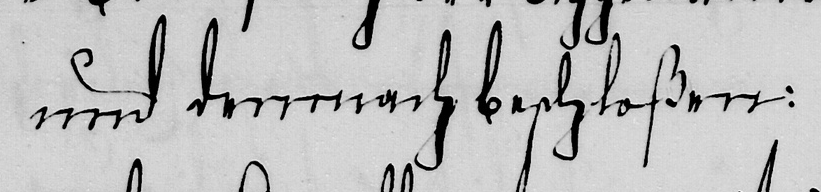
und demnach beschloßen:
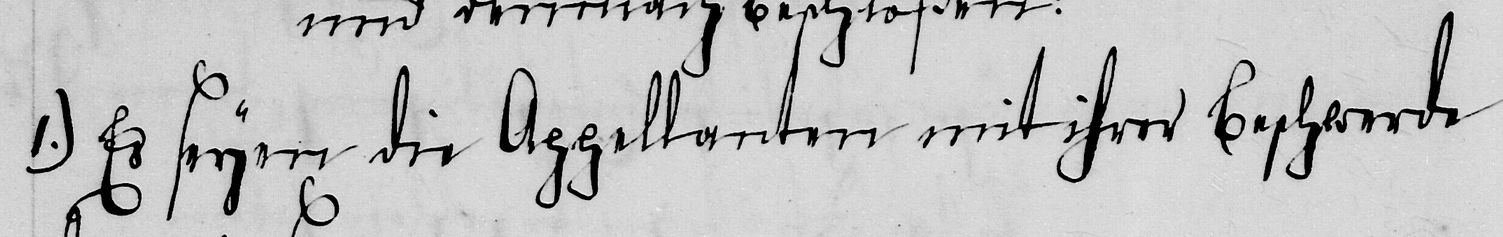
1.) Es seyen die Apellanten mit ihrer Beschwerde
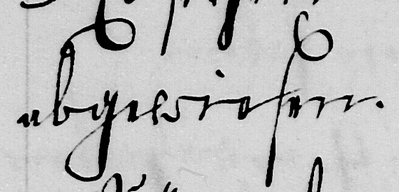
abgewiesen.
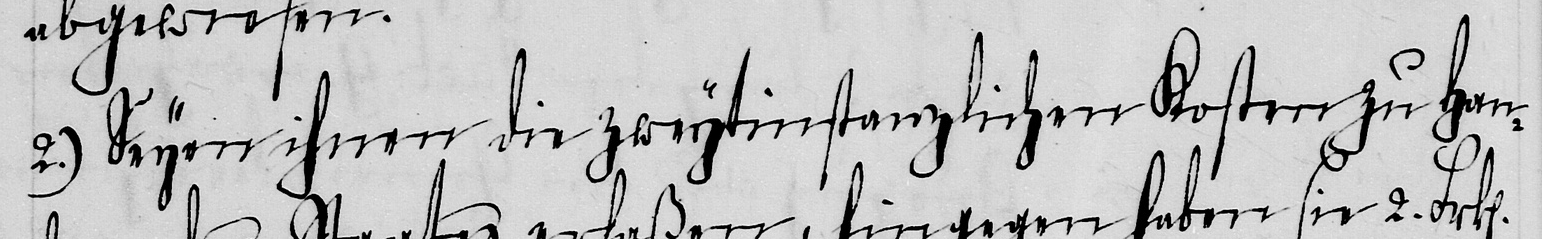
2.) Seyen ihnen die zweytinstanzlichen Kosten zu Han¬
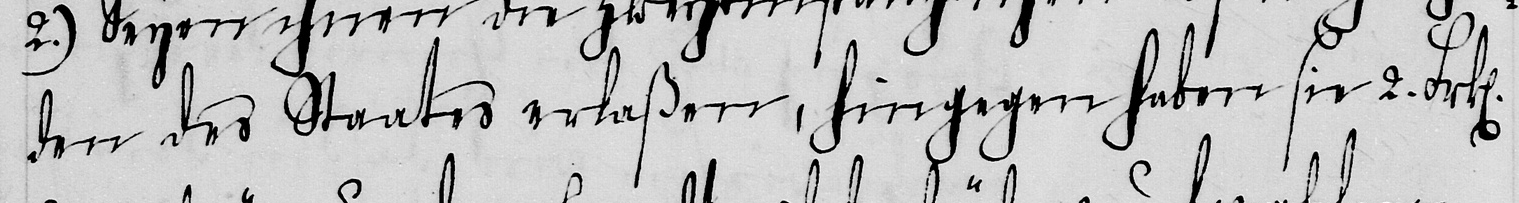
den des Staates erlaßen, hingegen haben sie 2. Frk[e¬
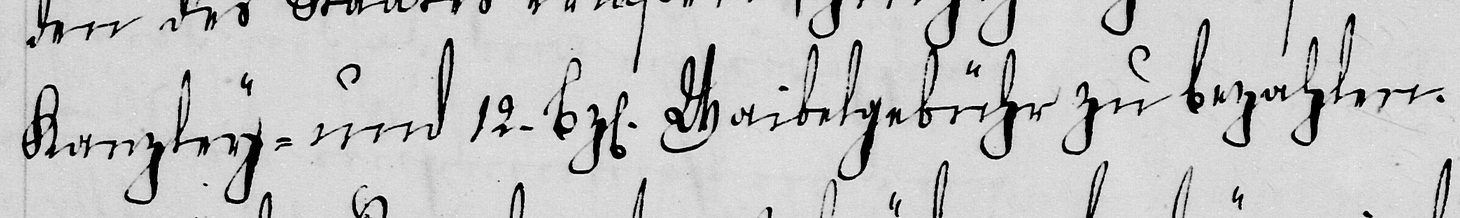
Kanzley- und 12. Bz[en]. Waibelgebühr zu bezahlen.
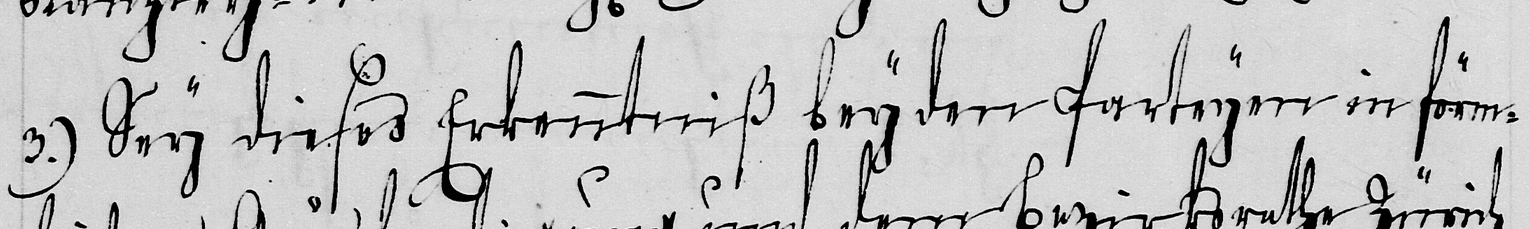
3.) Sey dieses Erkenntniß bey den Parteyen in förm¬
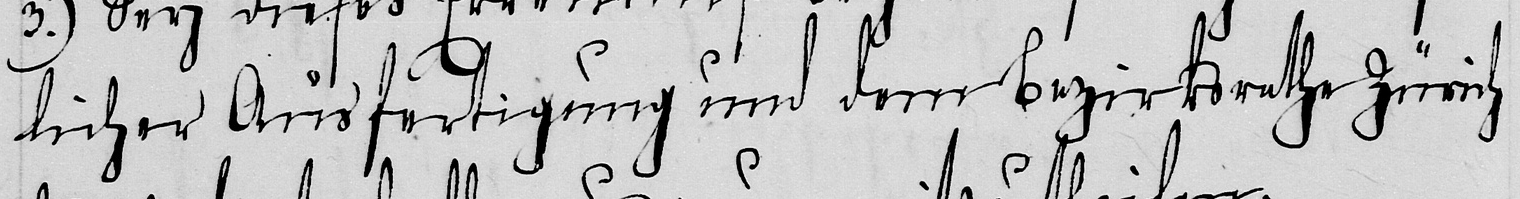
licher Ausfertigung und dem Bezirksrathe Zürich
